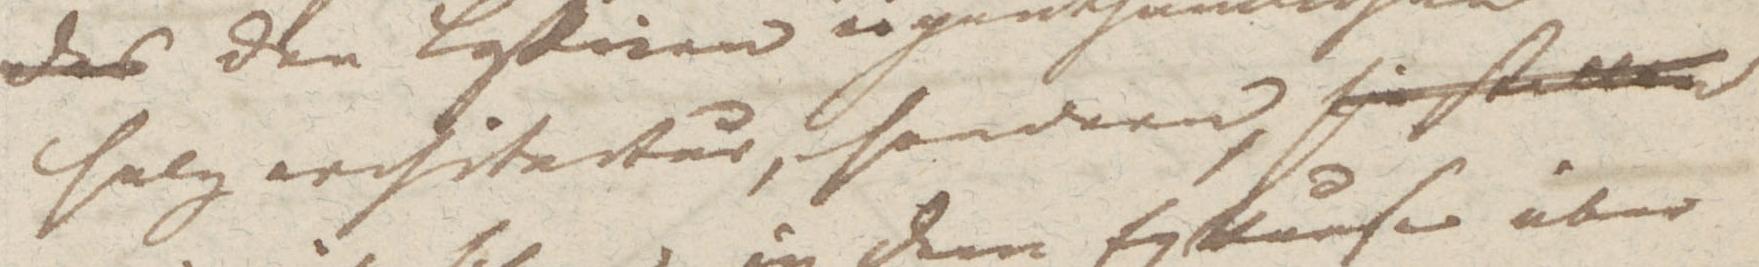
Holz architectur, sondern, sie stellen
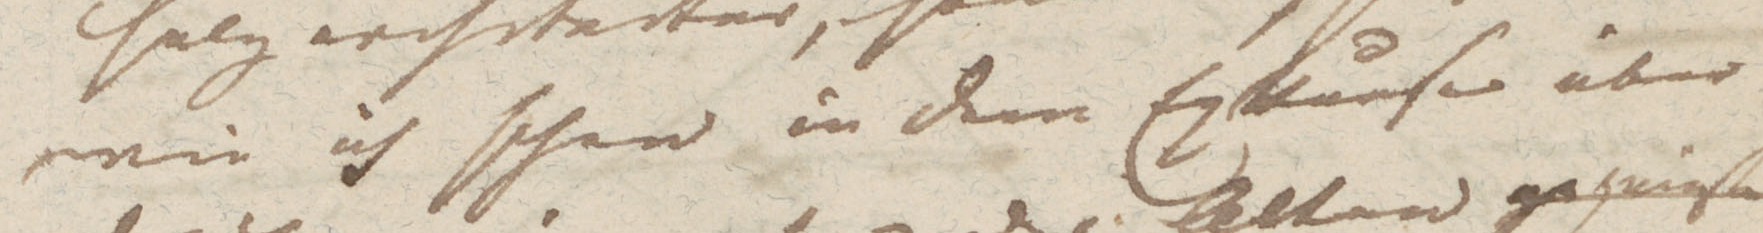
wie ich schon in dem Exkurse über
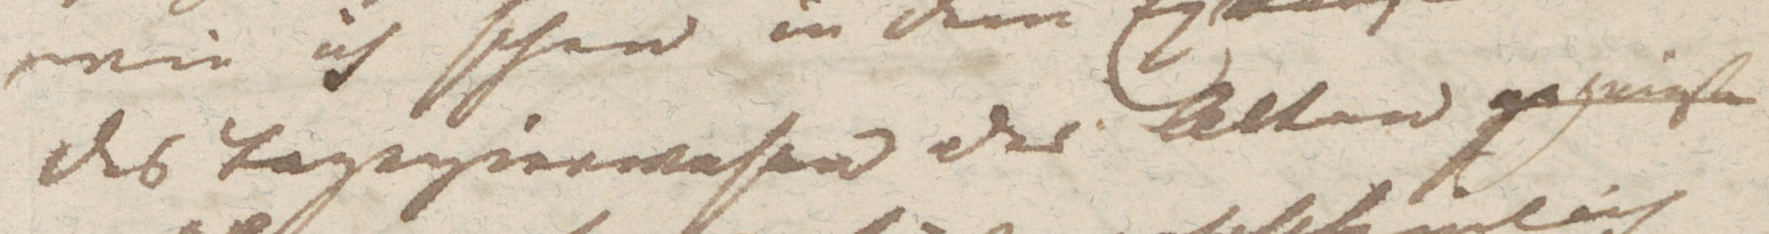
das Tapezierwesen der Alten gezeigt
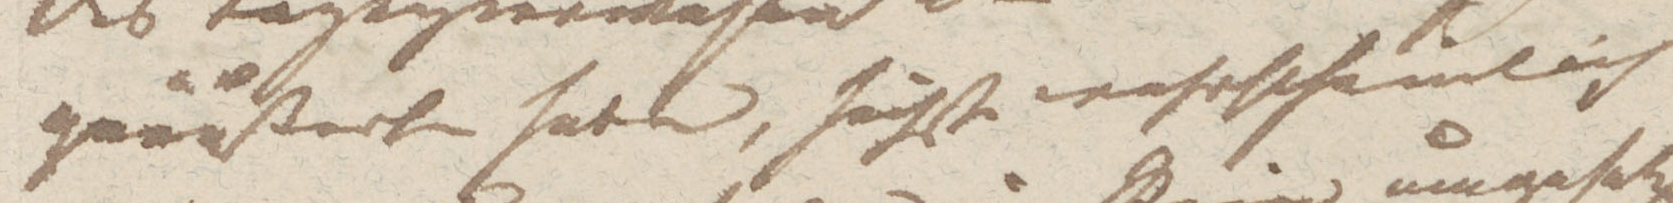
geäussert habe, höchst wahrscheinlich
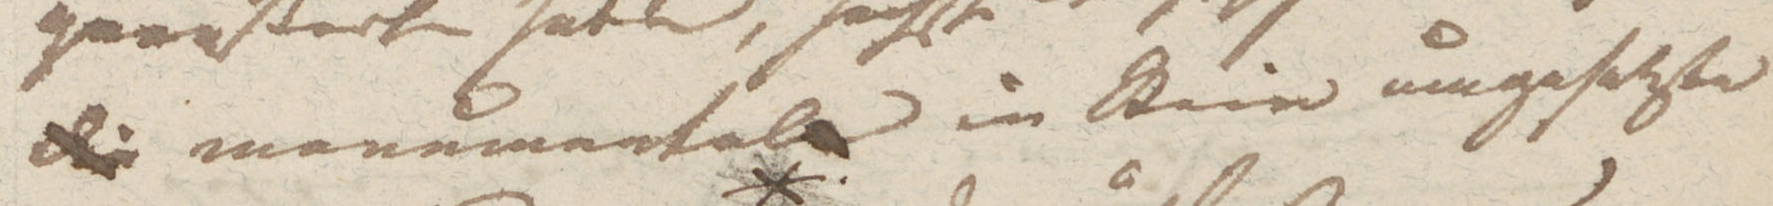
die monumentale in Stein umgesetzte
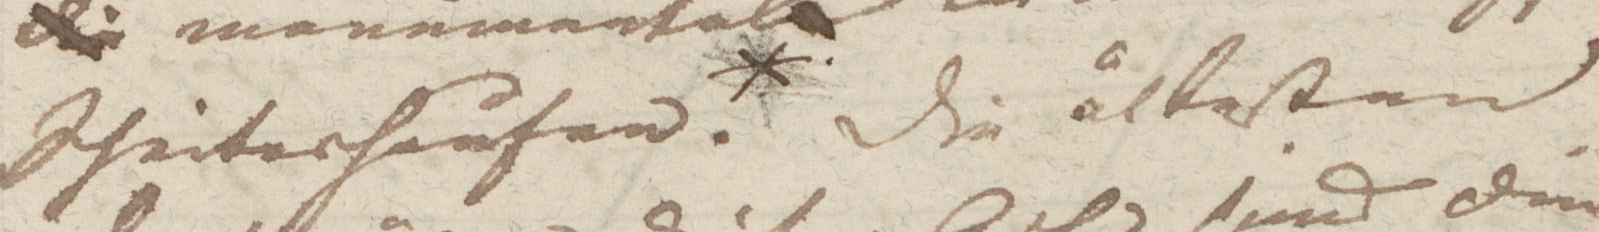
Scheiterhaufen. % Die ältesten
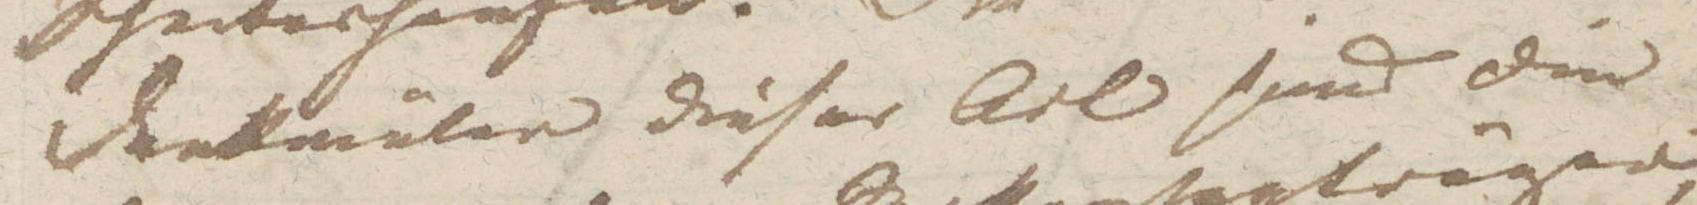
Denkmäler dieser Art sind die
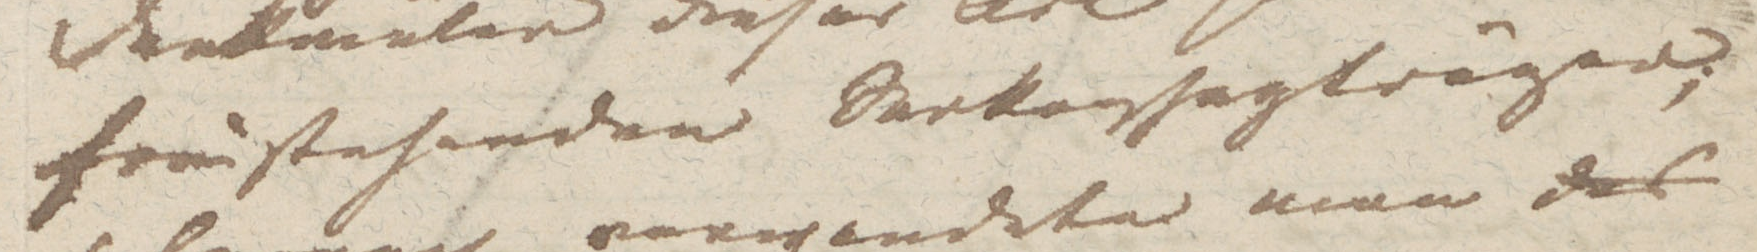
freistehenden Sarkophagträger;
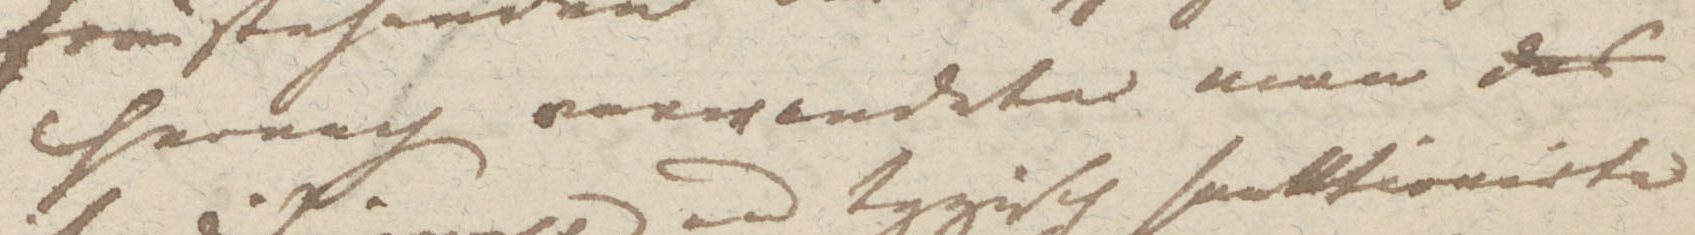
Hernach verwendete man das
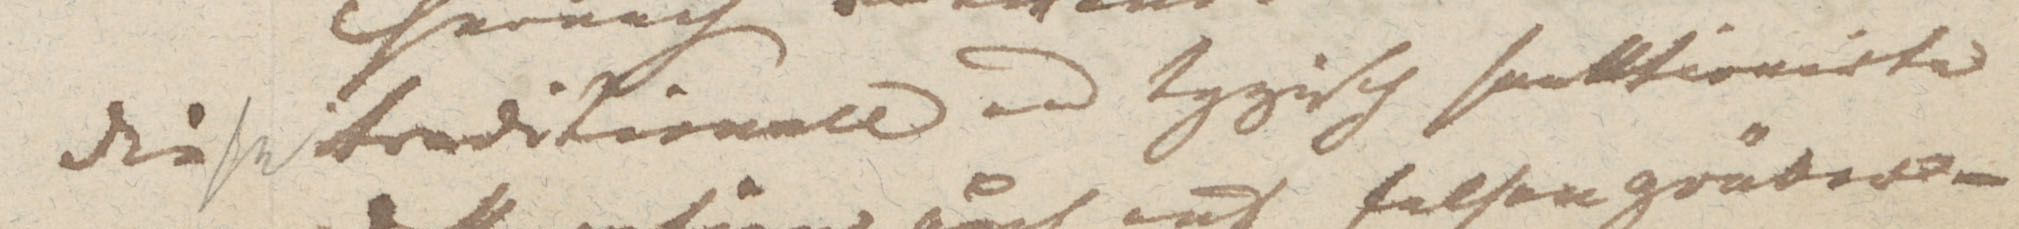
diese traditionell und typisch sanktionirte
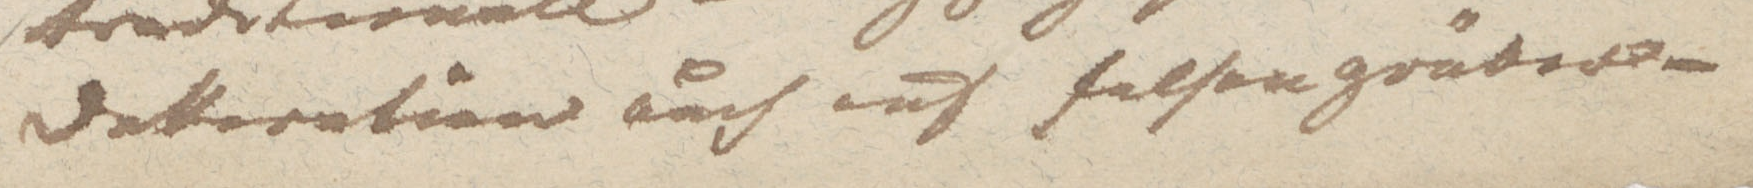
Dekoration auch auf Felsengräber-
